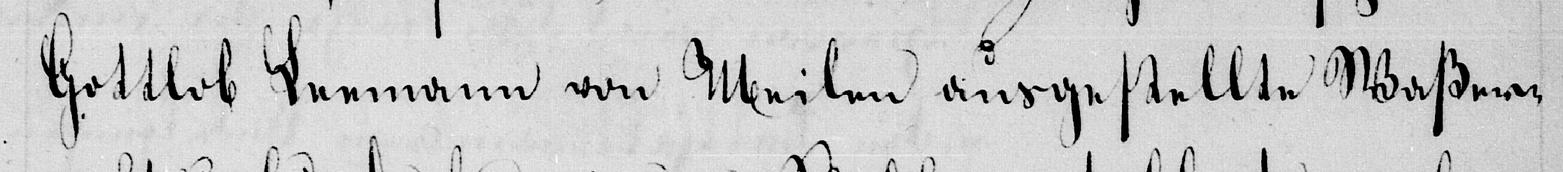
Gottlob Leemann von Meilen ausgestellte Waßer¬
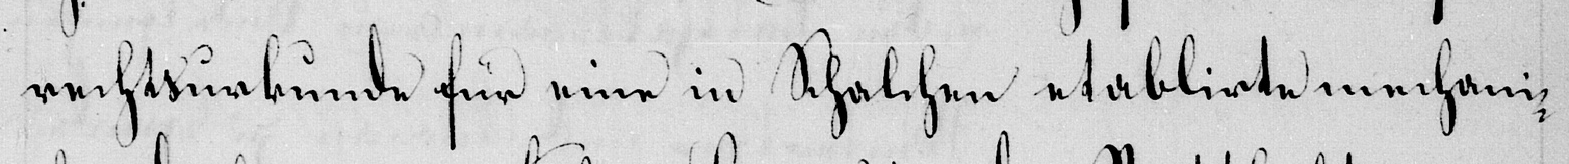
rechtsurkunde für eine in Schalchen etablirte mechani¬
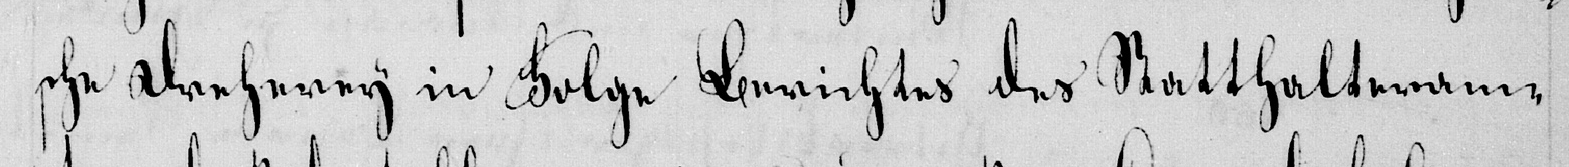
sche Dreherey in Folge Berichtes des Statthalteram¬
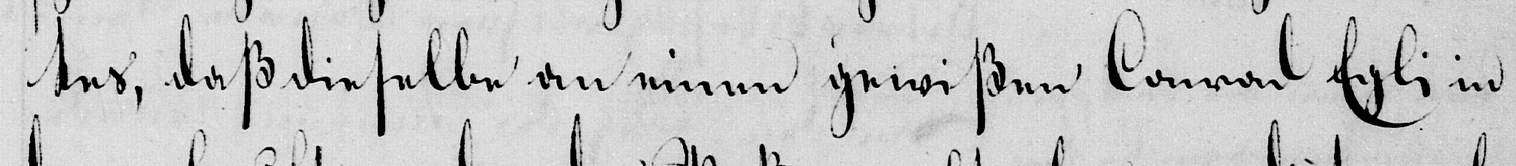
tes, daß dieselbe an einen gewißen Conrad Egli in
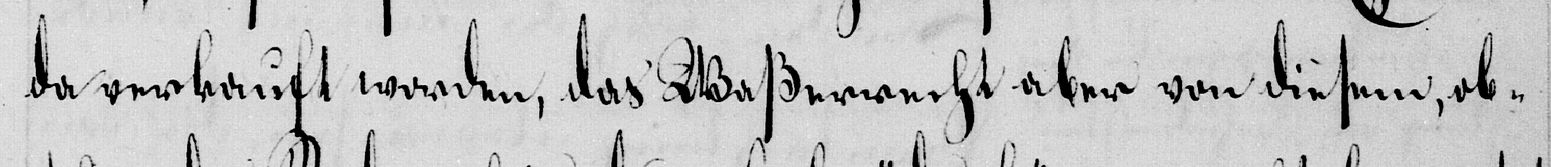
da verkauft worden, das Waßerrecht aber von diesem, ob¬
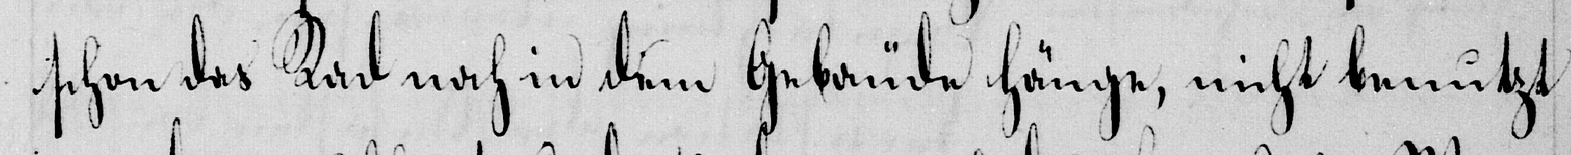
schon das Rad noch in dem Gebäude hänge, nicht benutzt
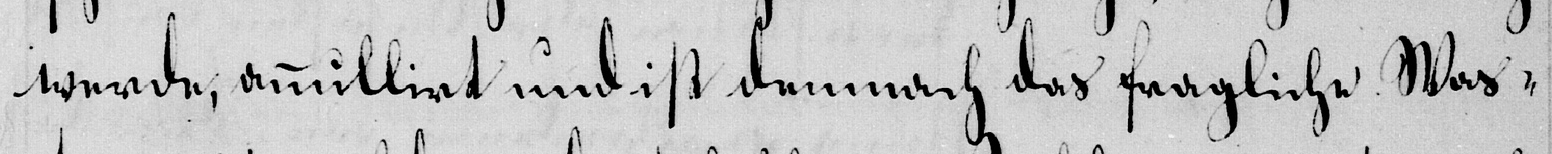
werde, annullirt und ist demnach das fragliche Waß¬
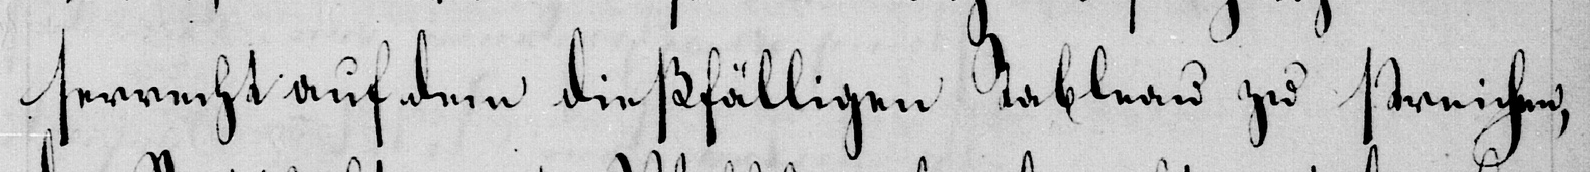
errecht auf dem dießfälligen Tableau zu streichen,
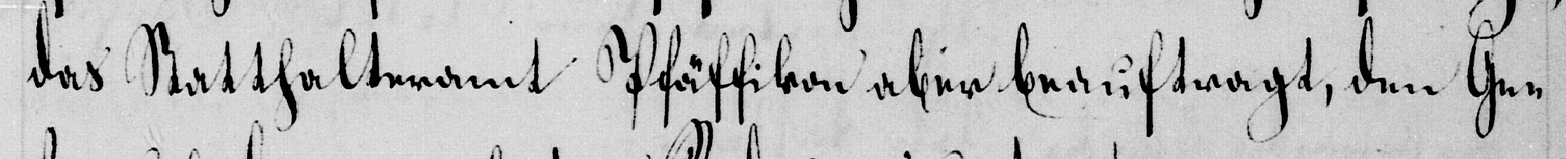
das Statthalteramt Pfäffikon aber beauftragt, den Ge¬
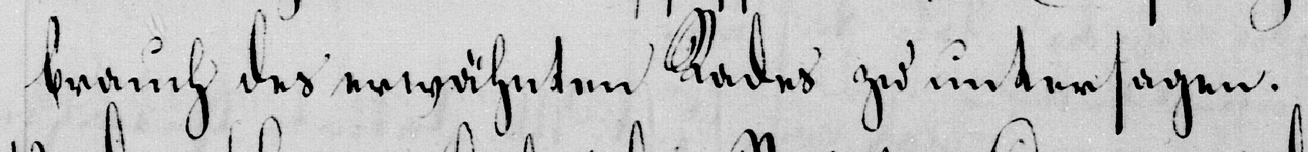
brauch des erwähnten Rades zu untersagen.
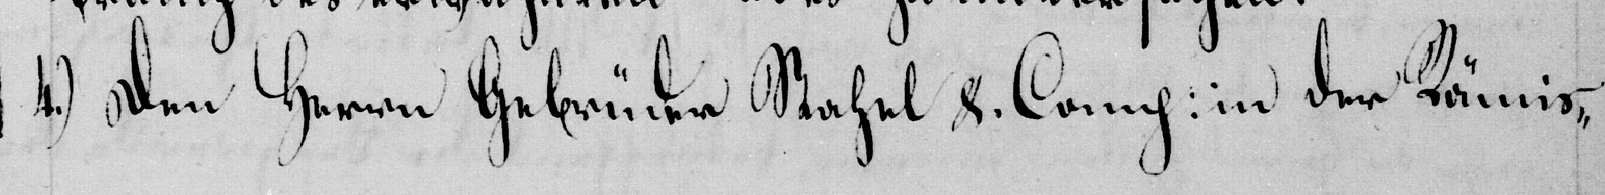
4.) Den Herren Gebrüder Stahel &. Comp: in der Rämis-
